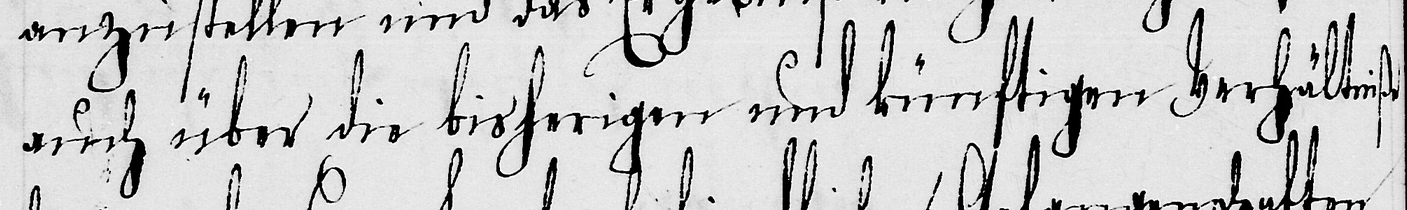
auch über die bisherigen und künftigen Verhältn¬
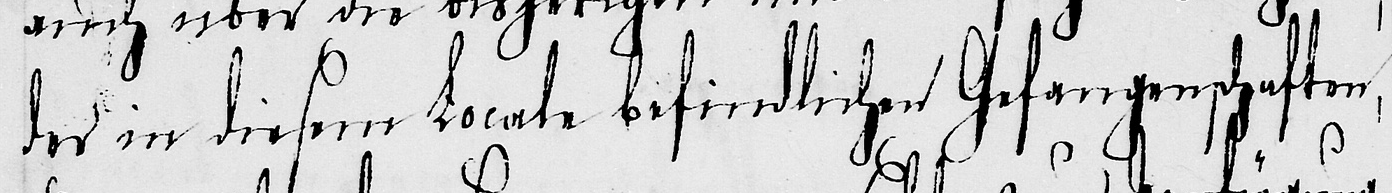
der in diesem Locale befindlichen Gefangenschafte¬
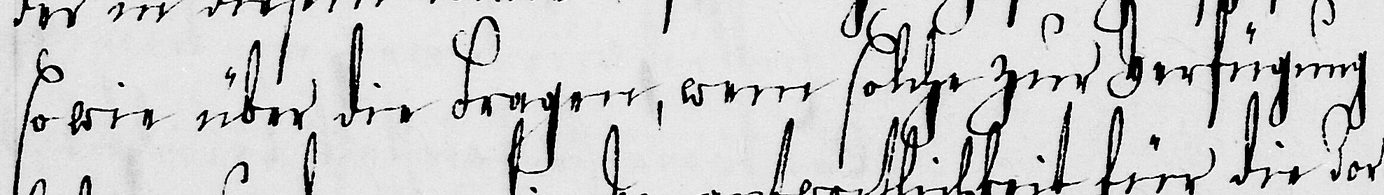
sowie über die Fragen, wem solche zur Verfügung
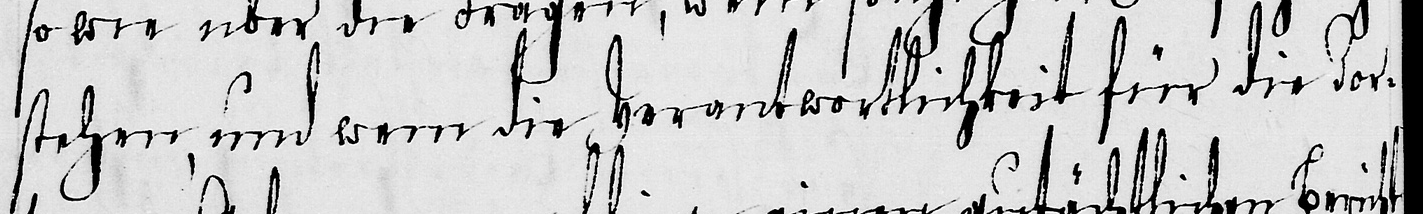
stehen, und wem die Verantwortlichkeit für die dor¬
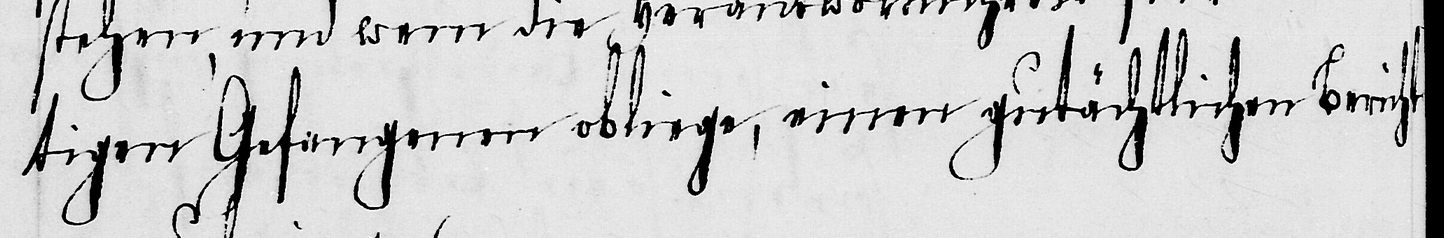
tigen Gefangenen obliegen, einen gutächtlichen Bericht
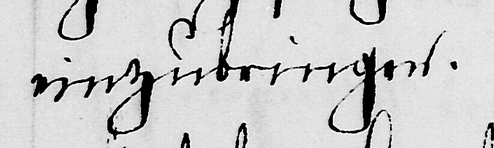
einzubringen.
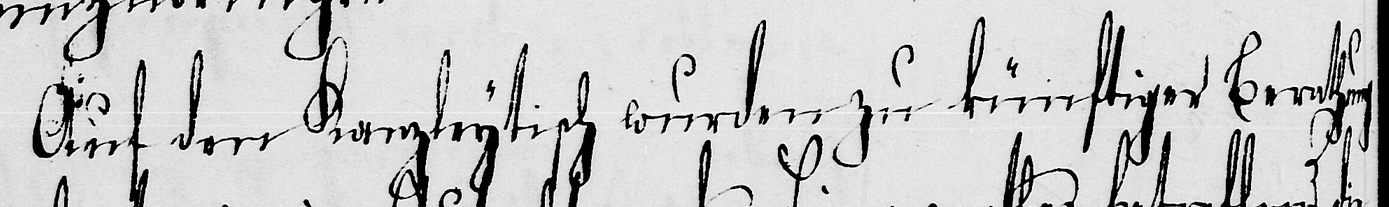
Auf den Kanzleytisch wurden zu künftiger Berath¬
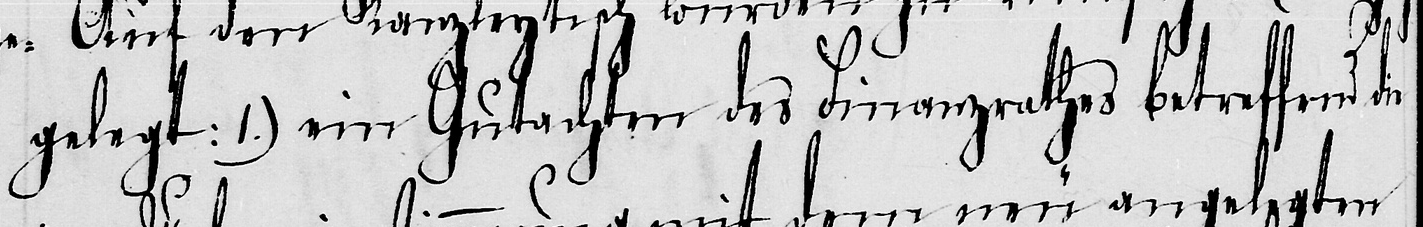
gelegt: 1.) ein Gutachten des Finanzrathes betreffend
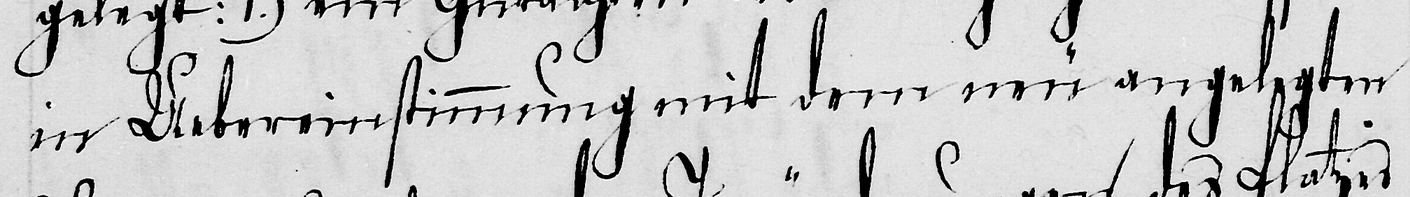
in Uebereinstimmung mit dem neu angelegten
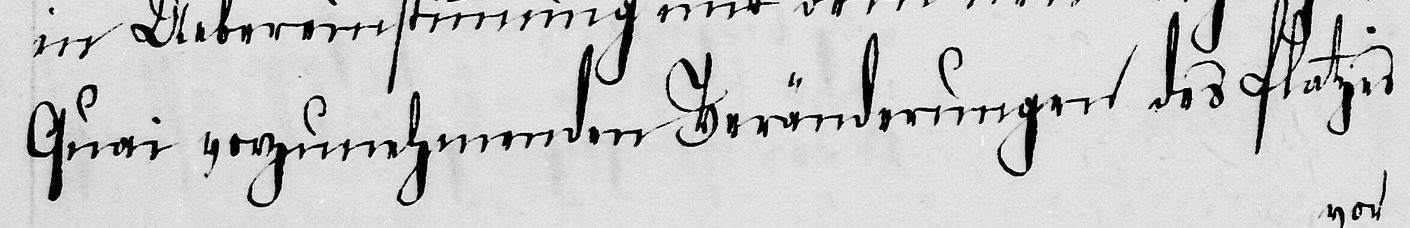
Quai vorzunehmenden Veränderungen des Platzes
